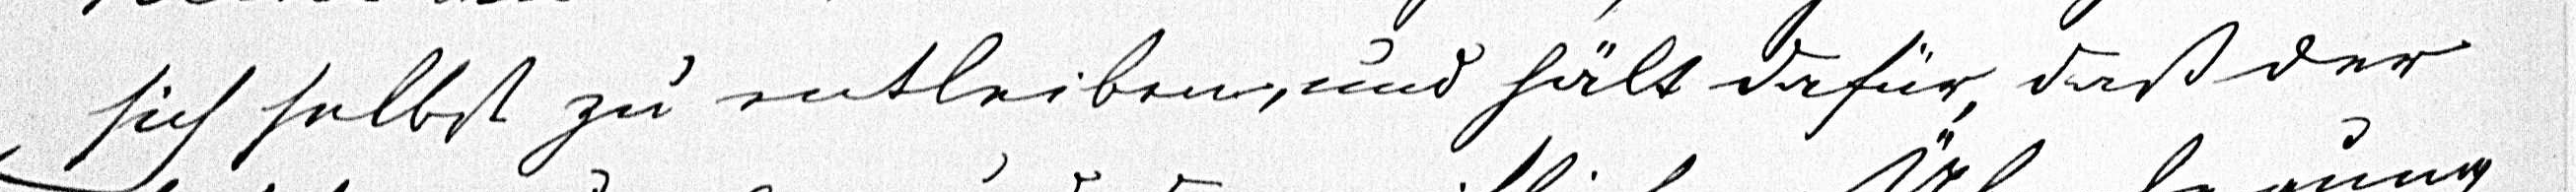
sich selbst zu entleiben, und hält dafür, daß der
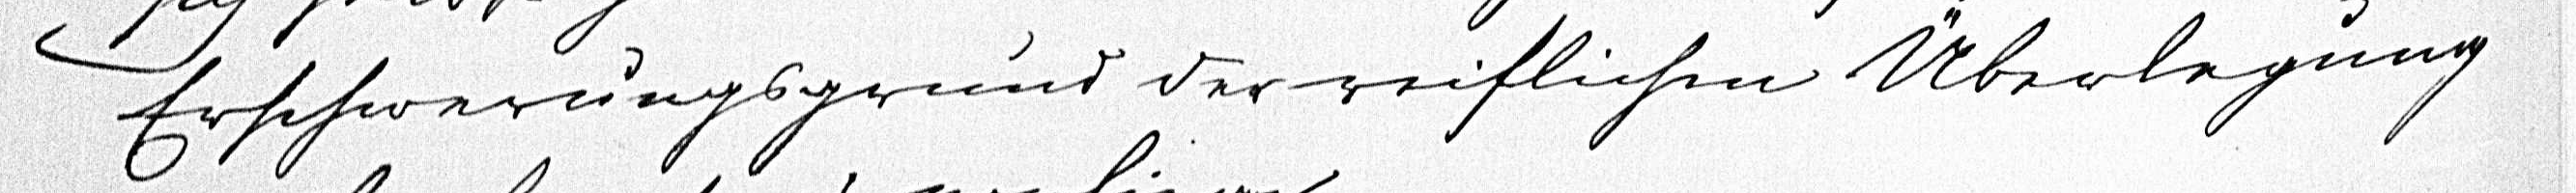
Erschwerungsgrund der reiflichen Überlegung
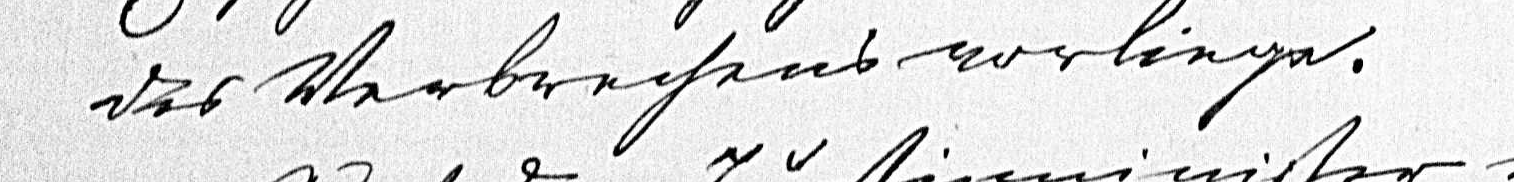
des Verbrechens vorliege.
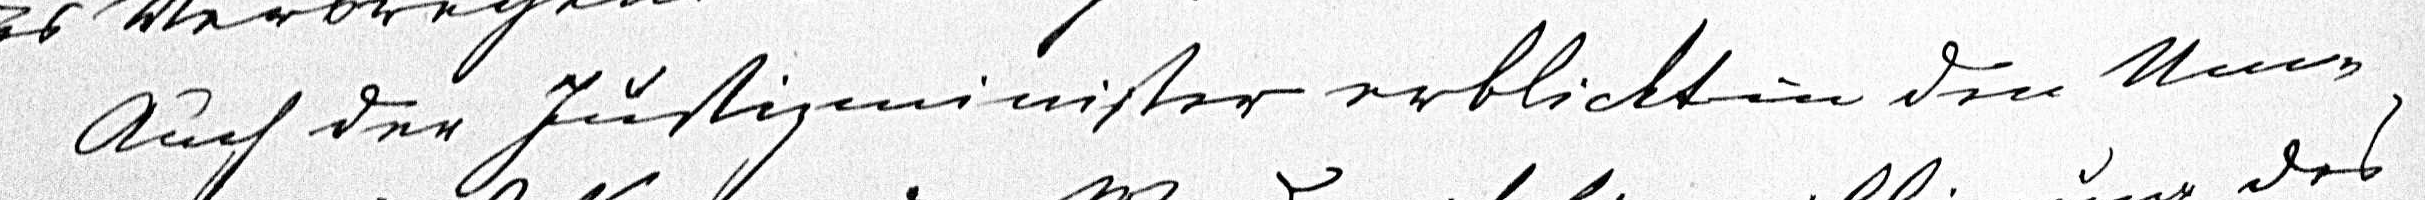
Auch der Justizminister erblicht in den Um¬
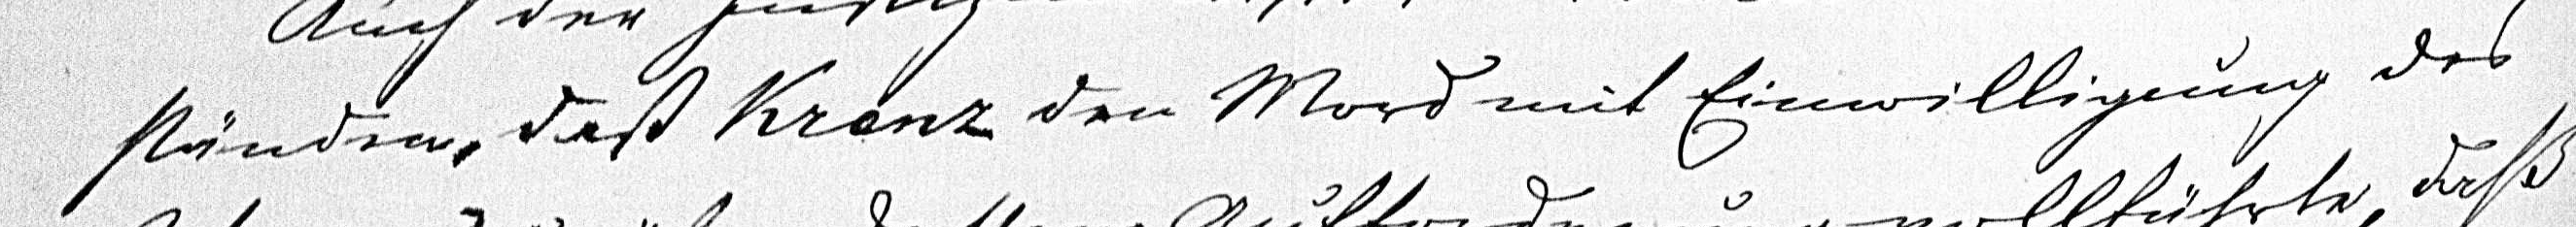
ständen, daß Kranz den Mord mit Einwilligung des
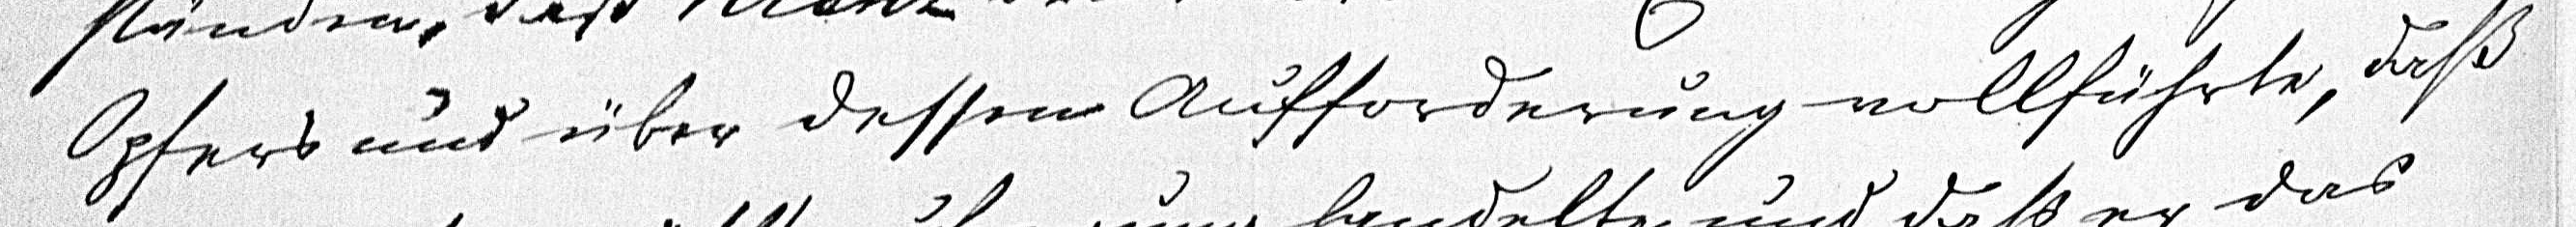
Opfers und über dessen Aufforderung vollführte, daß
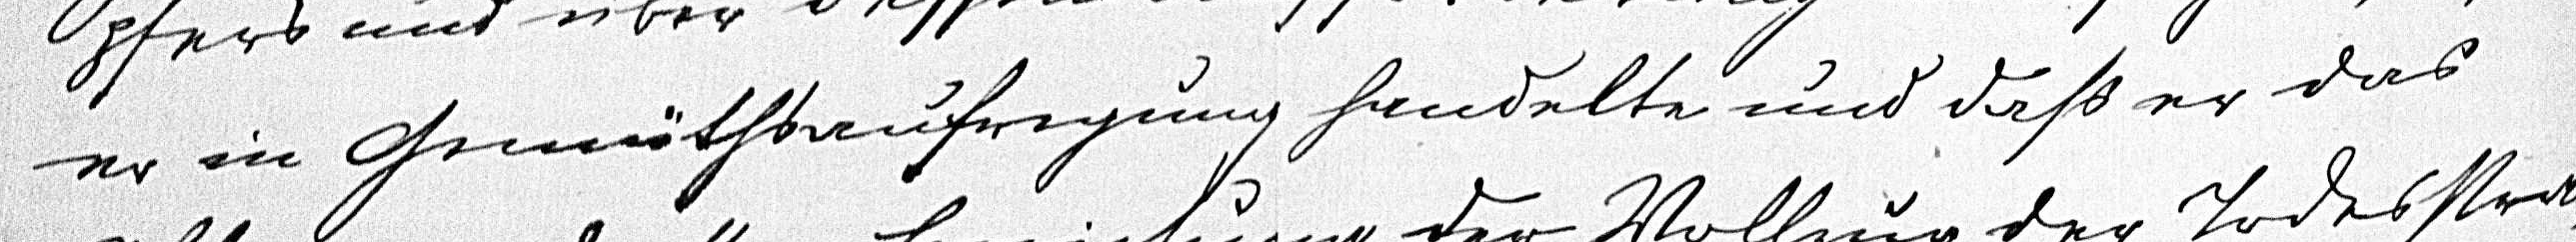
er in Gemüthsaufregung handelte und daß er das
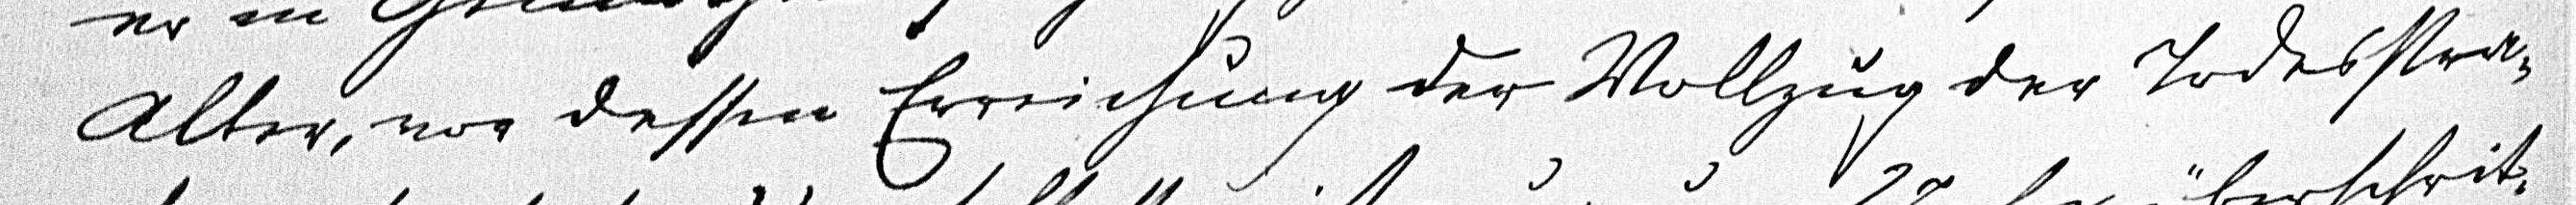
Alter, vor dessen Erreichung der Wollzug der Todesstra¬
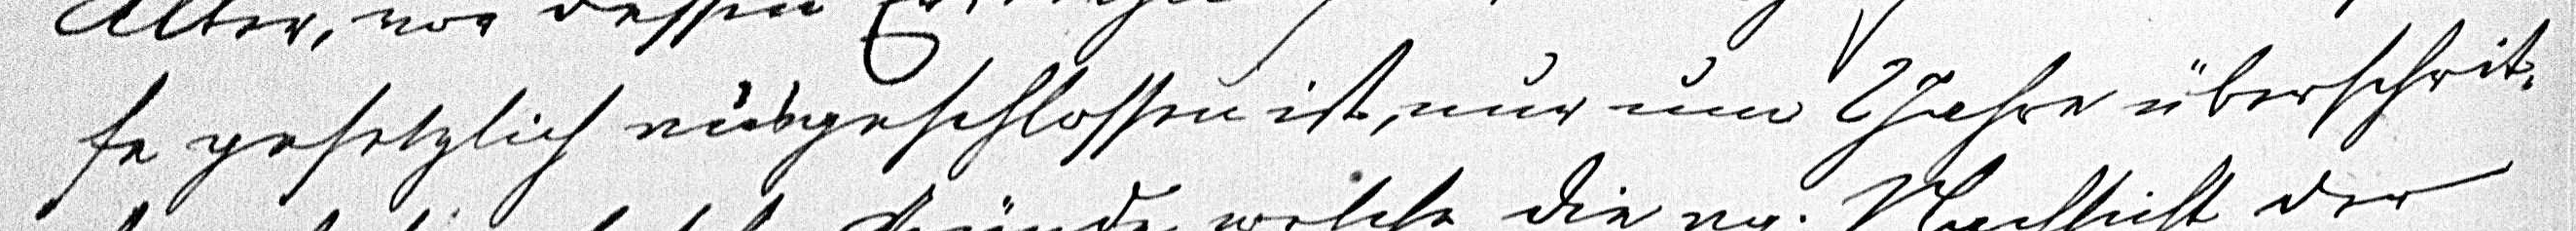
fe gesetzlich ausgeschlossen ist, nur um 2 Jahre überschrit¬
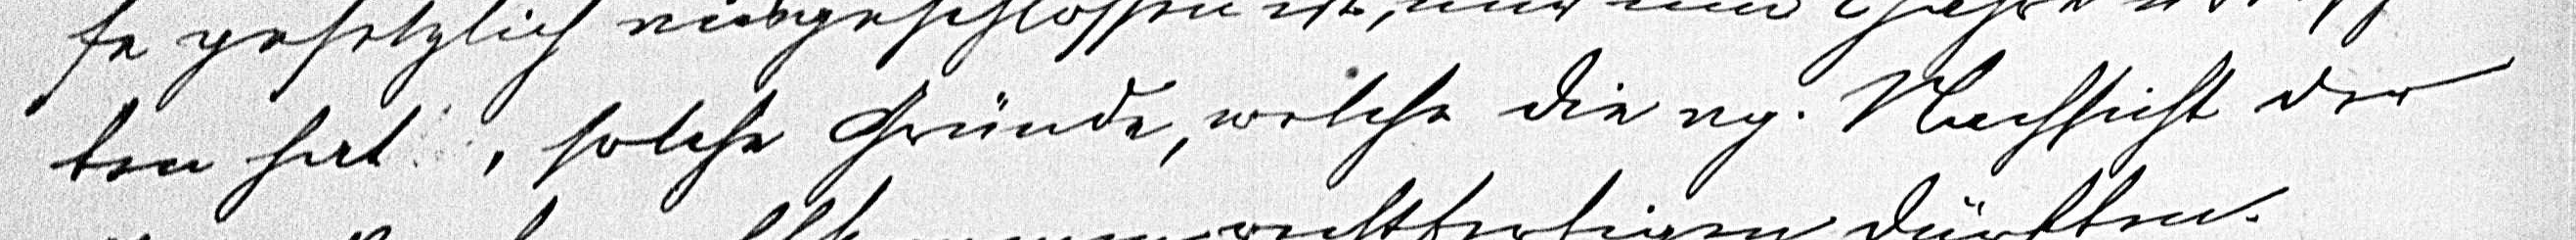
ten hat, solche Gründe, welche die eg. Nachsicht der
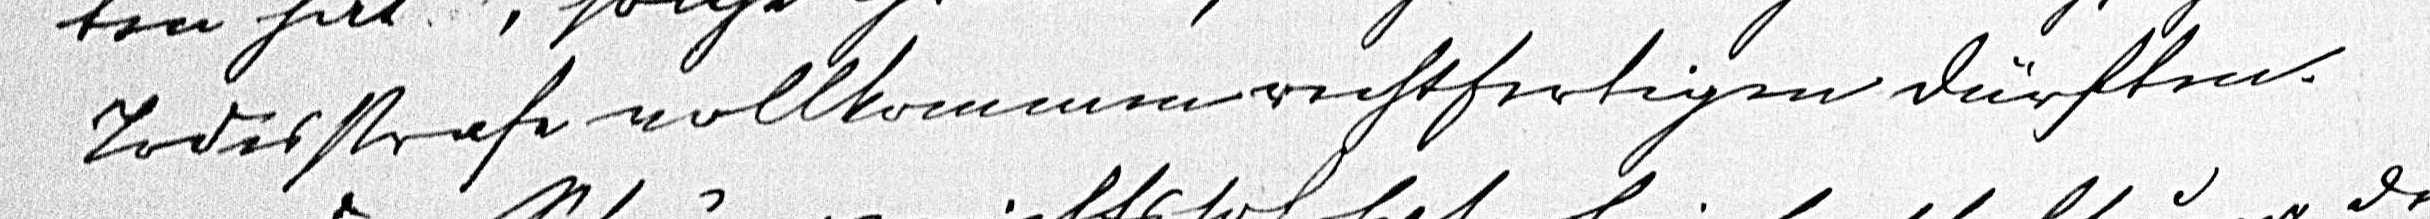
Todestrafe vollkommen rechtfertigen dürften.
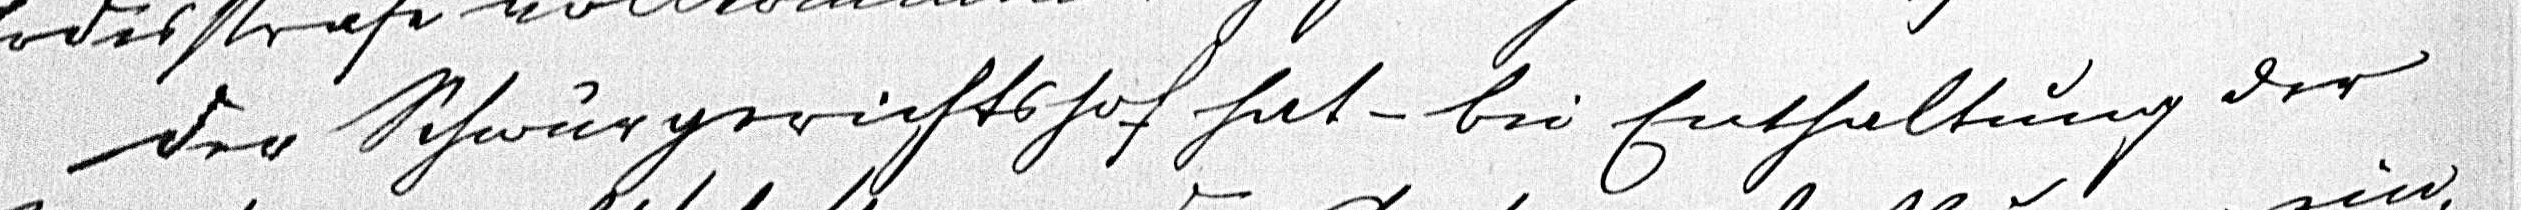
Der Schwurgerichtshof hat - bei Enthaltung der
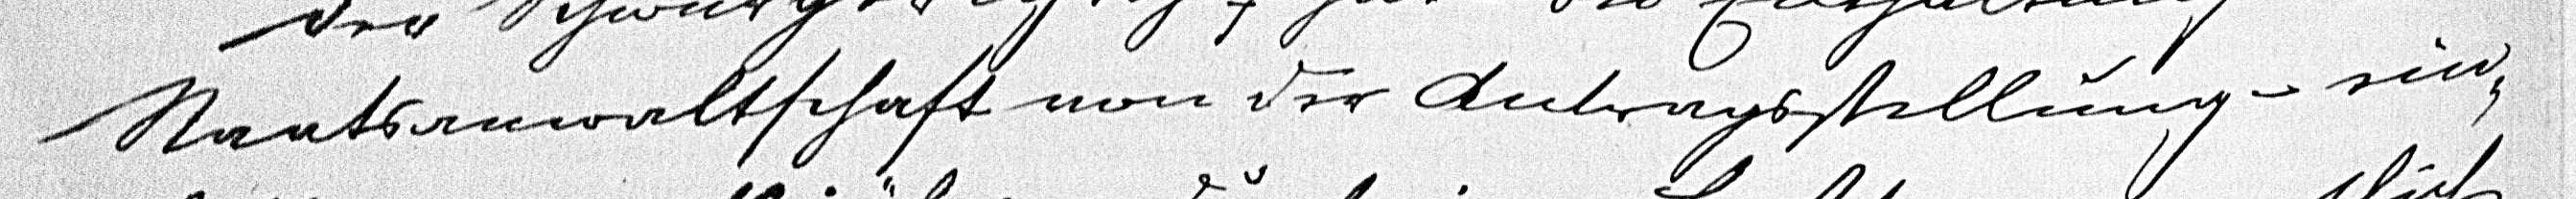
Staatsanwaltschaft von der Antragsstellung - ein
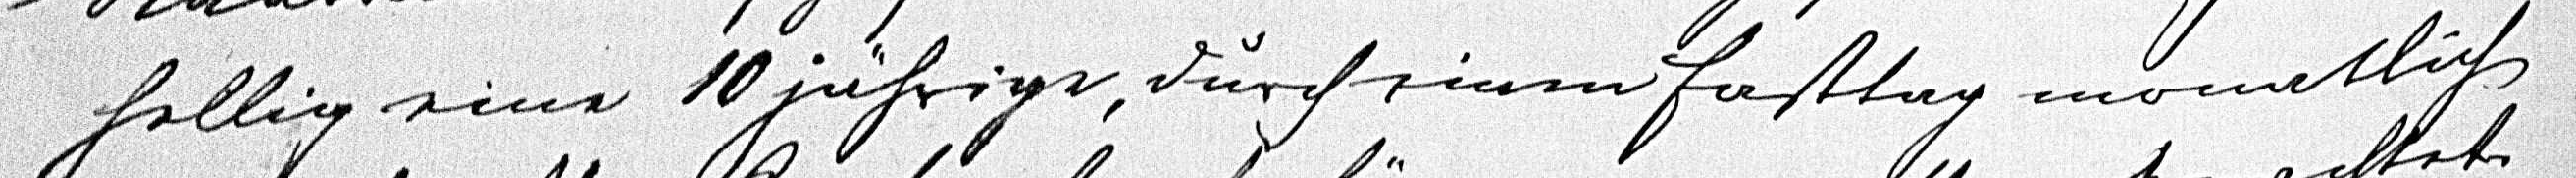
hellig eine 10 jährige, durch einen Fasttag monatlich
